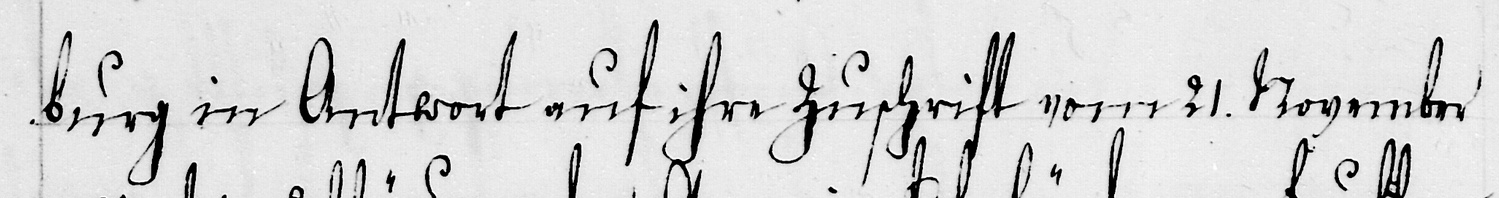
burg in Antwort auf ihre Zuschrift vom 21. November
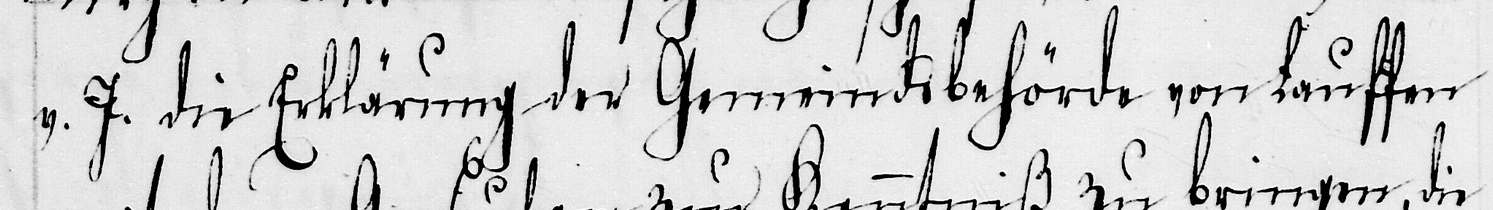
v. J. die Erklärung der Gemeindsbehörde von Lauffen
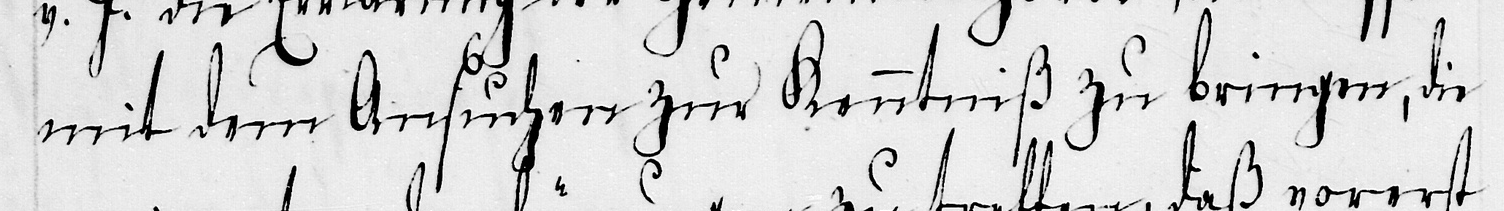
mit dem Ansuchen zur Kenntniß zu bringen, die
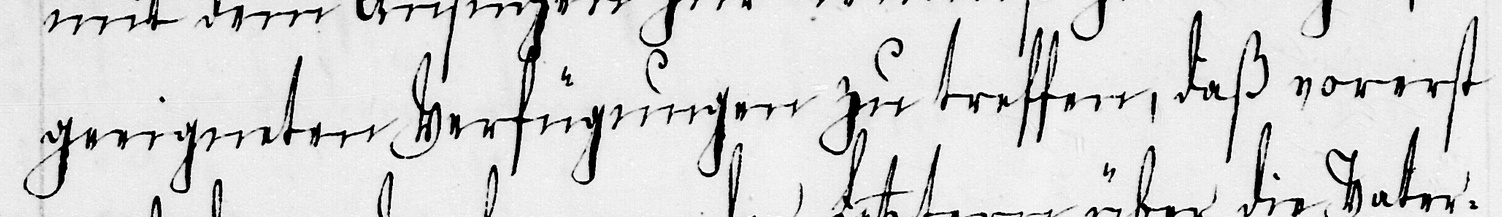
geeigneten Verfügungen zu treffen, daß vorerst
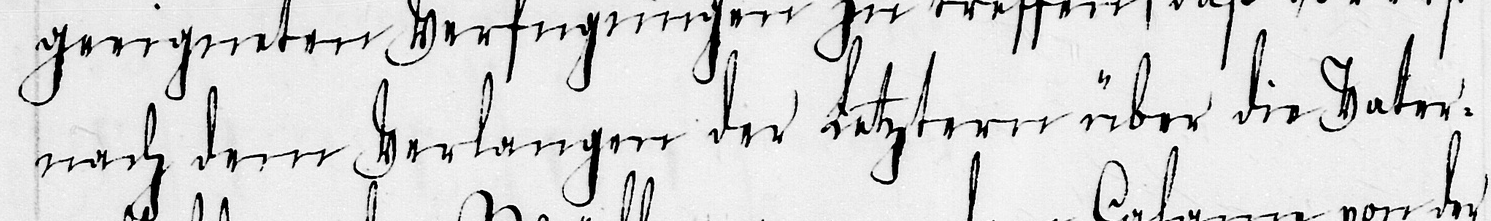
nach dem Verlangen der Letztern über die Vater¬
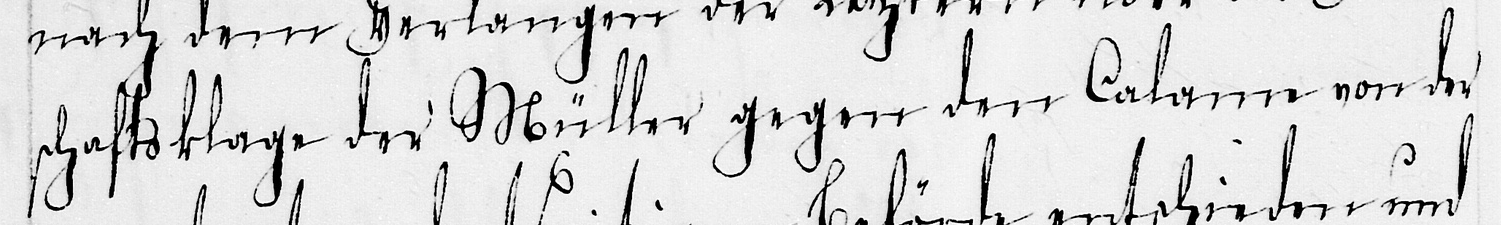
schaftsklage der Müller gegen den Calame von der
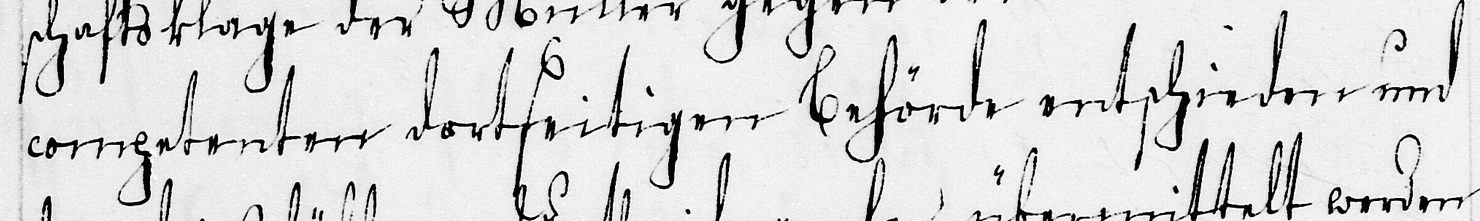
competenten dortseitigen Behörde entschieden und
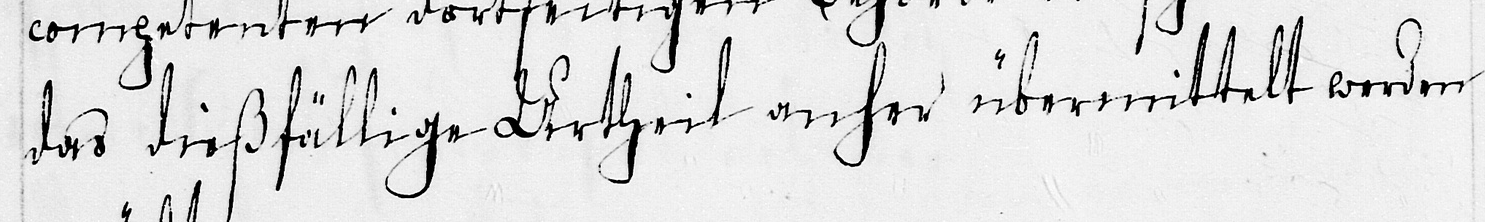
das dießfällige Urtheil anher übermittelt werden
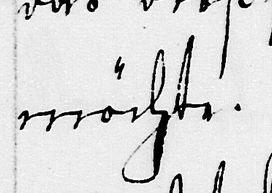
möchte.
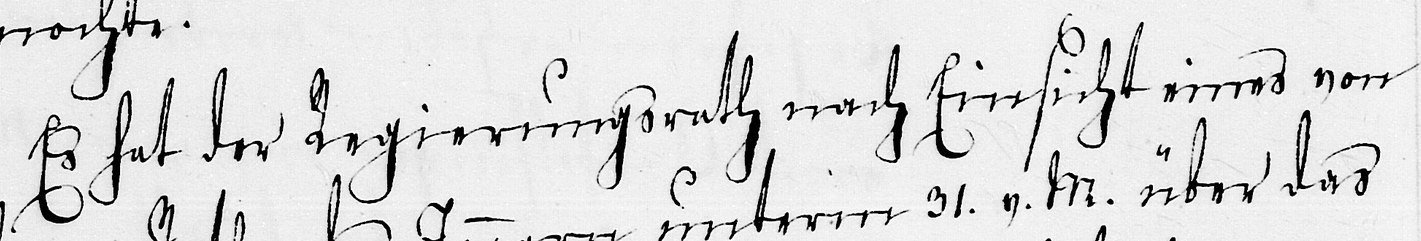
Es hat der Regierungsrath nach Einsicht eines von
